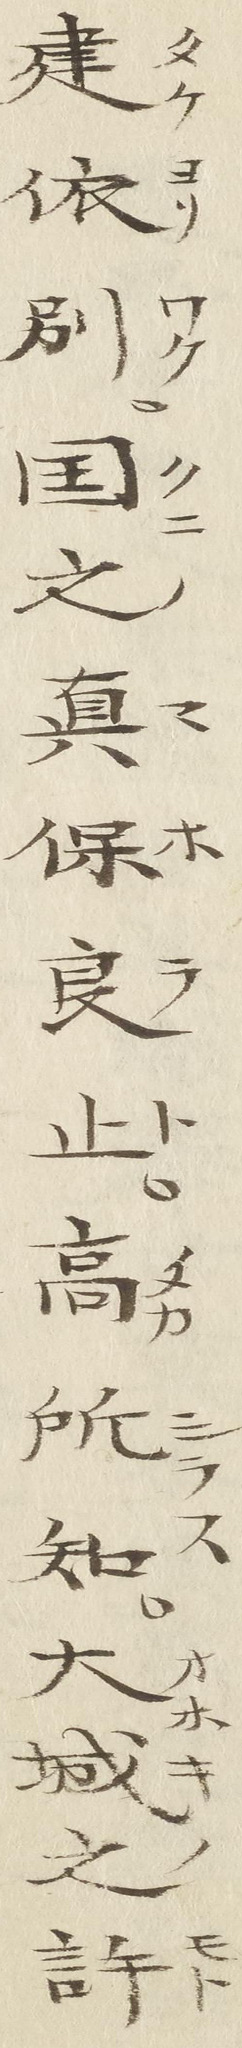建依別。国之真保良止。高所知。大域之許
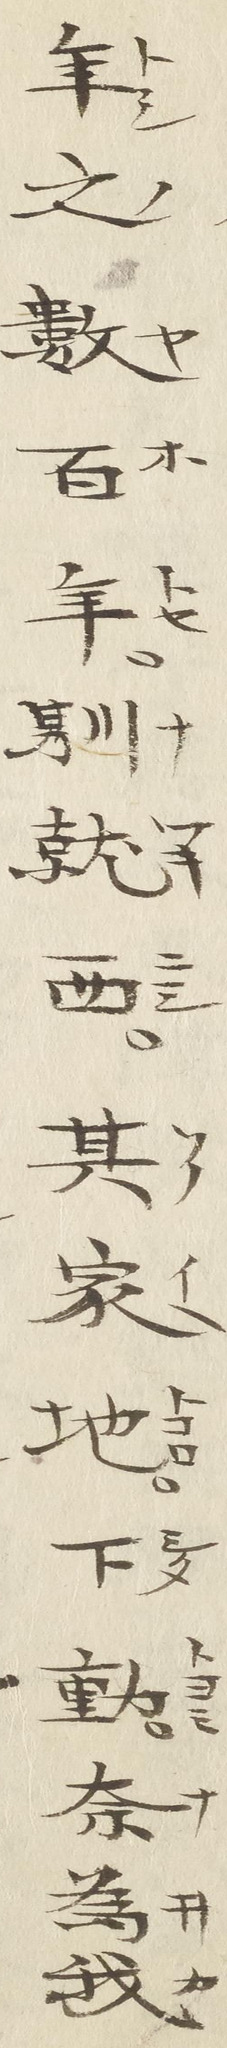年之数百年。馴就西。其家地。下動。奈為我
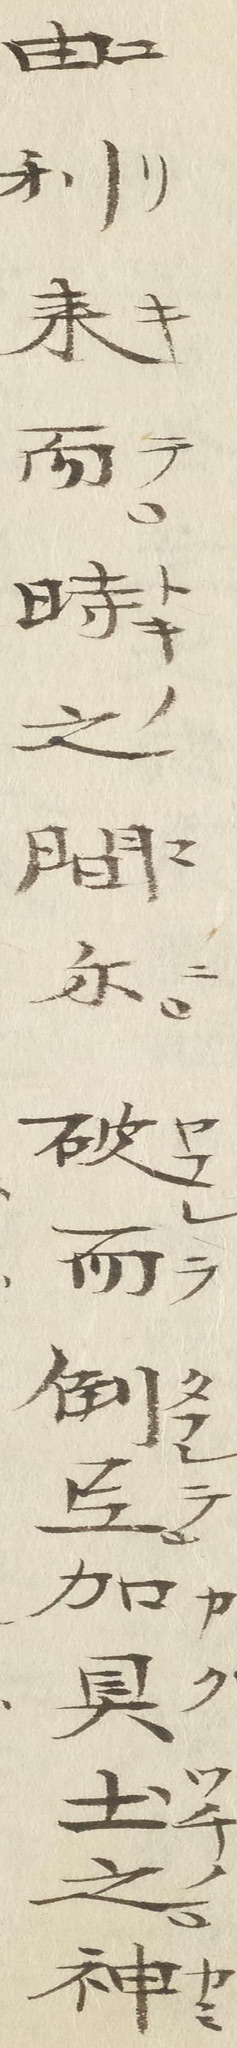由利来而。時之間尓。破而倒至。加具土之。神
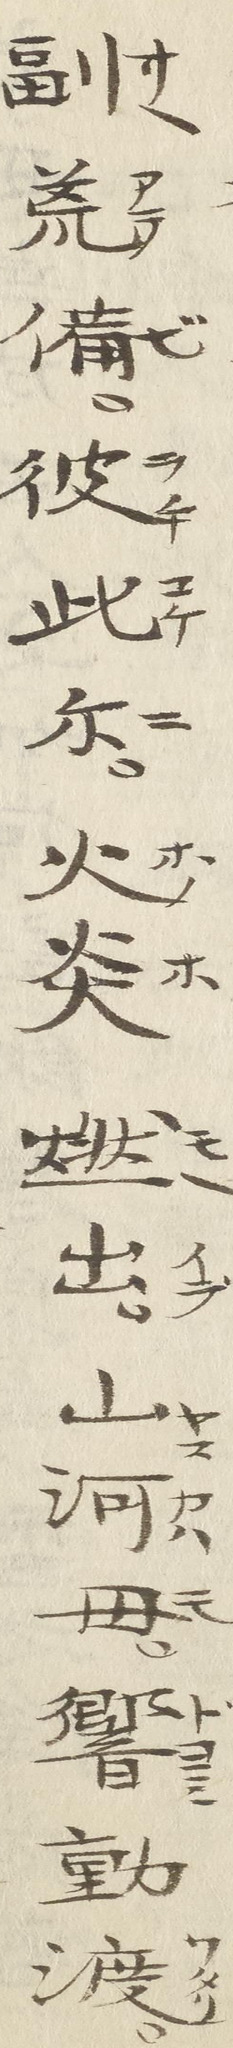副荒備。彼地尓。火炎燃出。山河母。響動渡。
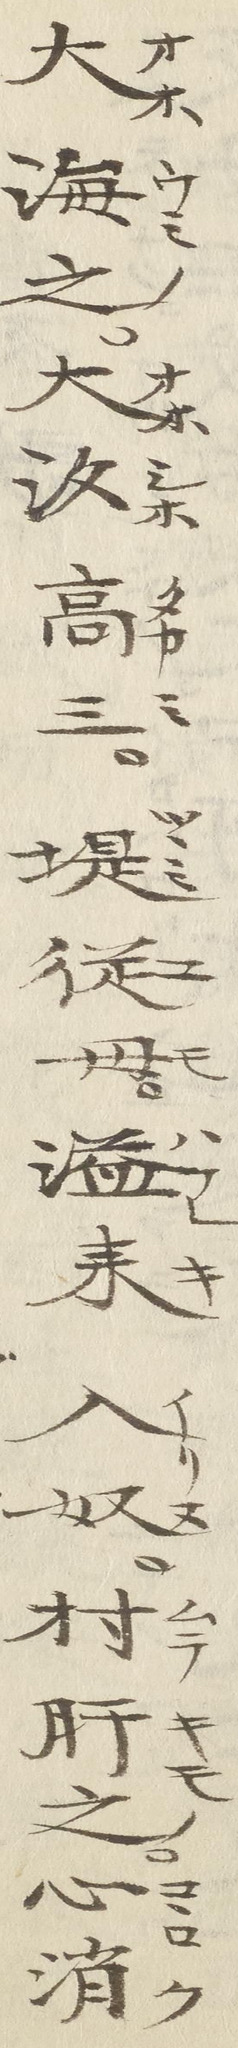大海之。大汐高三。堤従母。溢来入奴。村肝之。心消
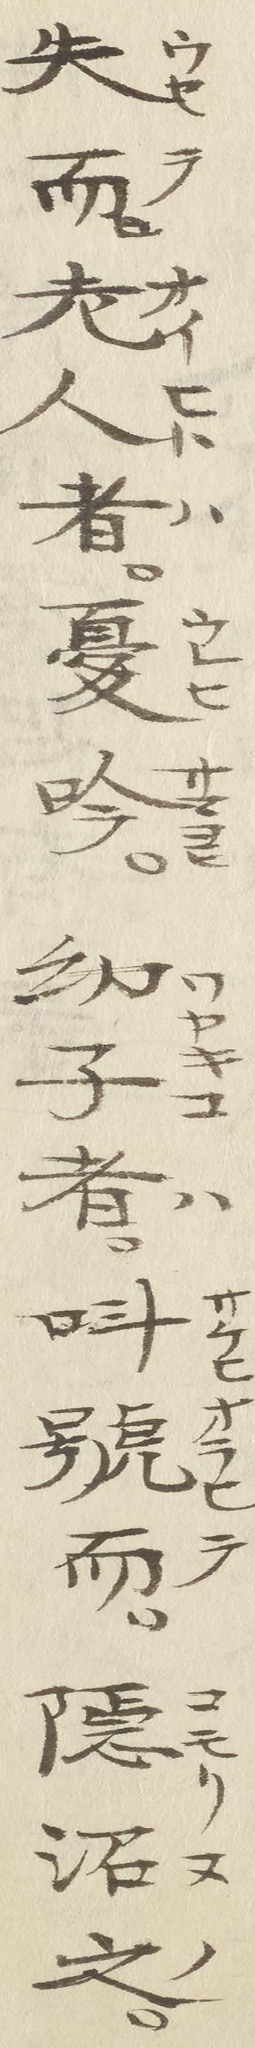失而。老人者。憂吟。幼子者。叫號而。隠沼之。
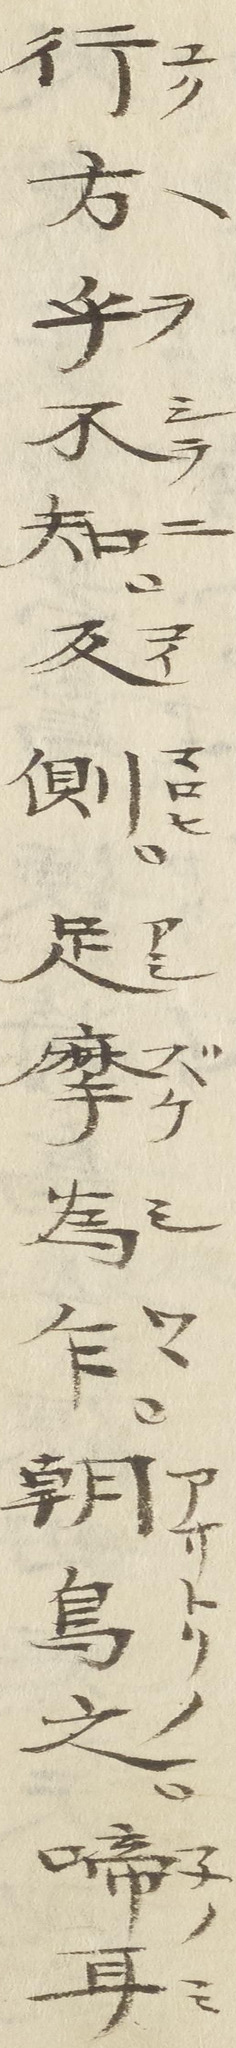行方乎不知。反側。足摩為乍。朝鳥之。啼耳

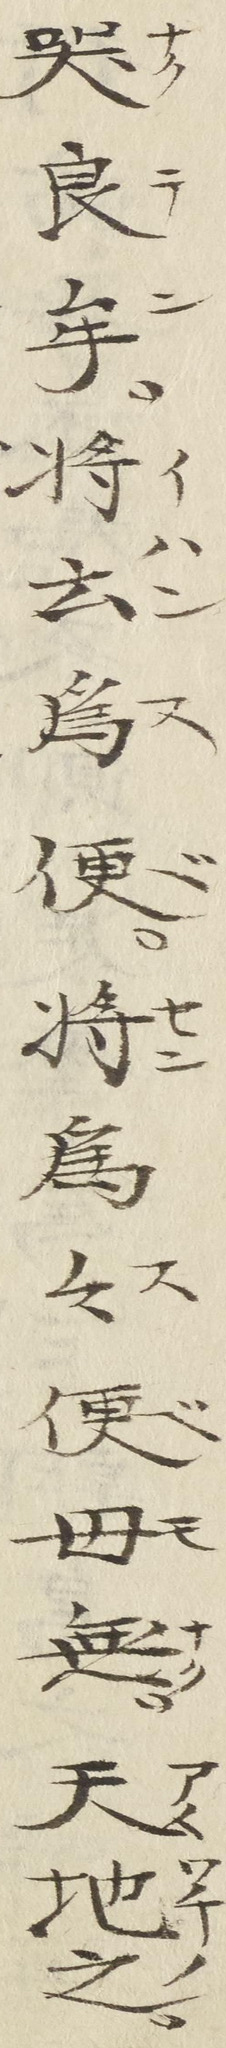哭良牟。将云為便。将為今便母無。天地之。
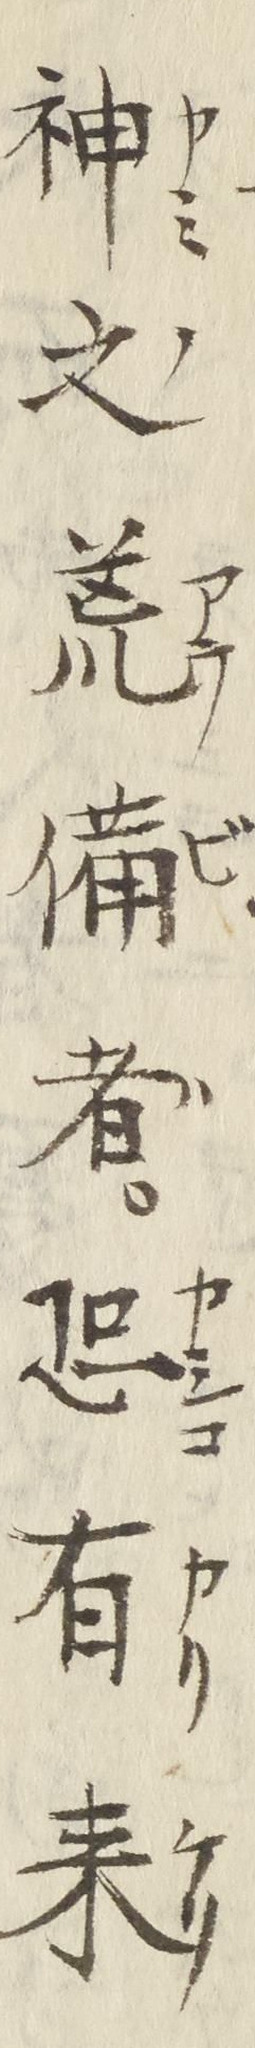神之荒備者。恐有来
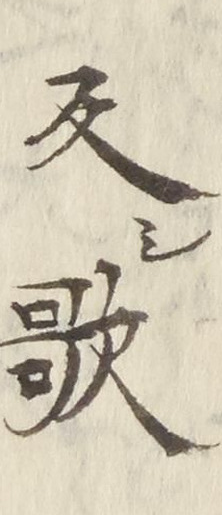反シ歌
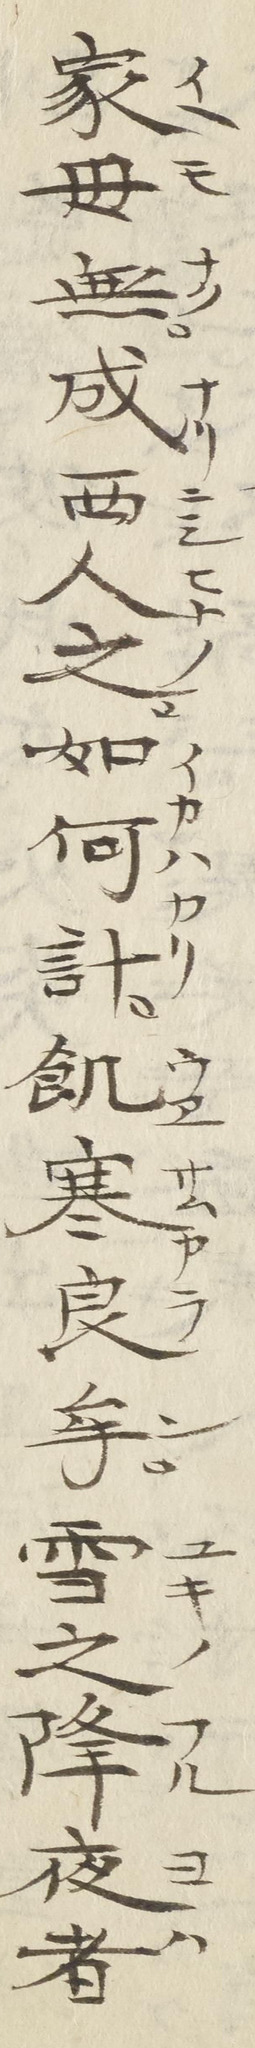家母無。成西人之。如何計。飢寒良牟。雪之降夜者
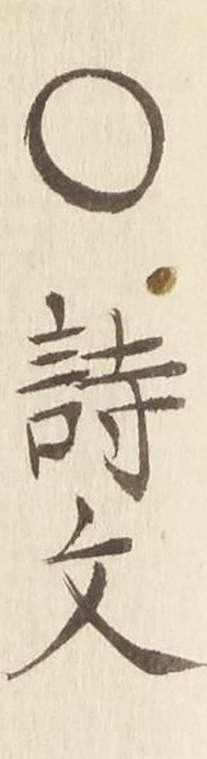◯詩文
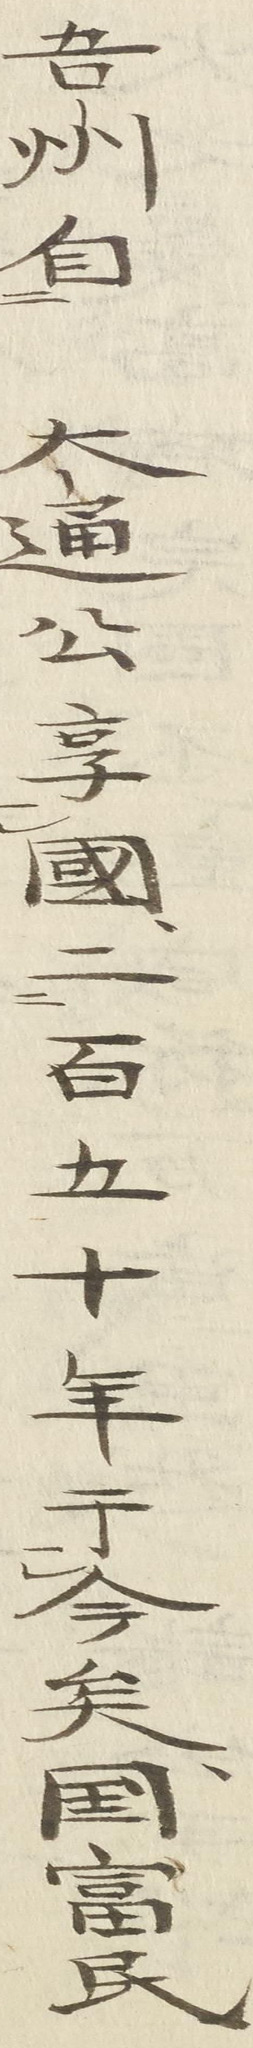吾洲自大-通公享国、二百五十年干今矣、国富民
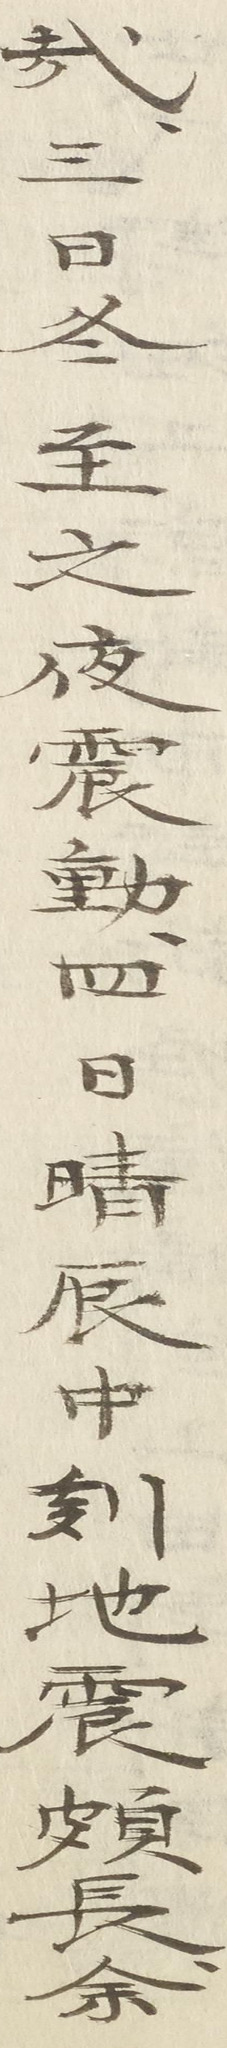哉、三日冬至之夜震動、四日晴辰中刻地震頗長、余
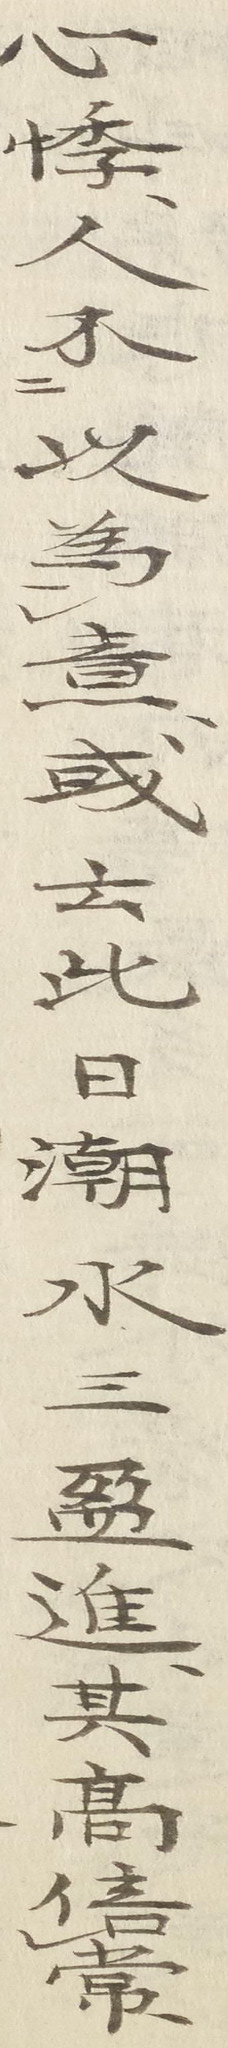心悸、人不以為意、或云此日潮水三盈進、其高倍常
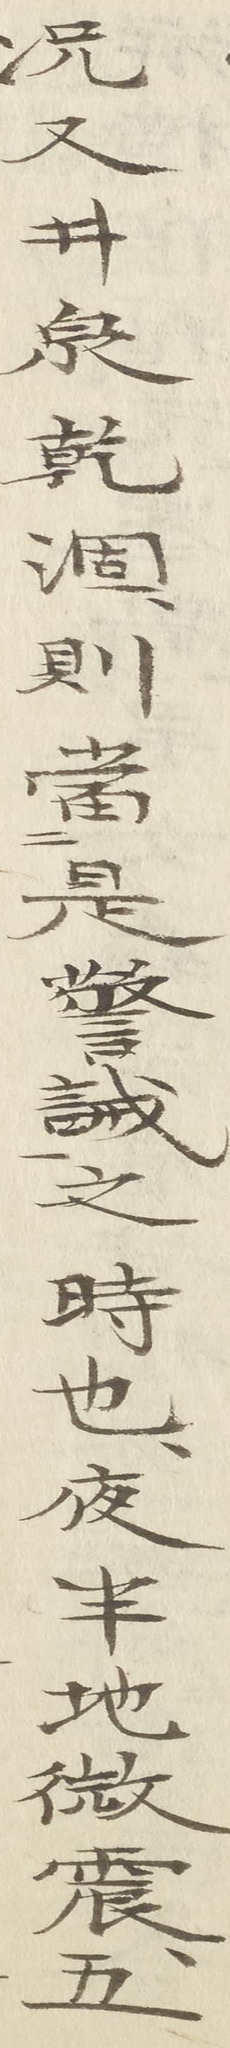況又井泉乾涸、則当是警誡之時也、夜半地徴震、五
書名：地震記　下
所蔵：東京大学地震研究所図書室 Earthquake Research Institute Library, The University of Tokyo, JAPAN
